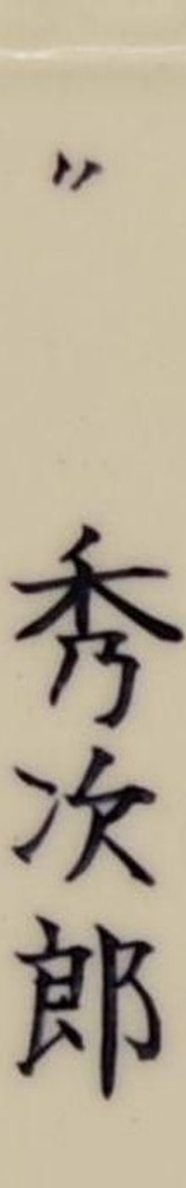秀次郎
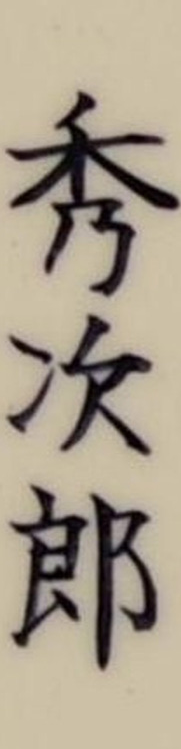秀次郎
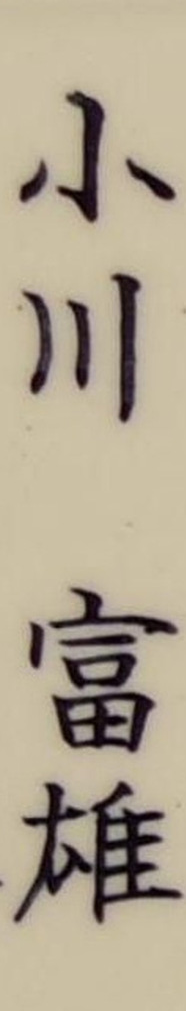小川富雄
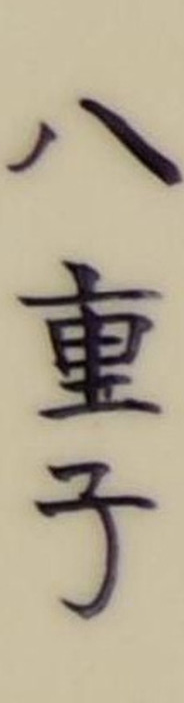八重子
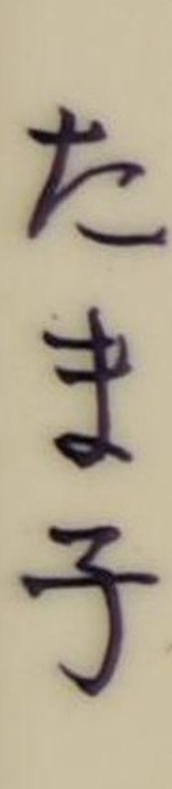たま子

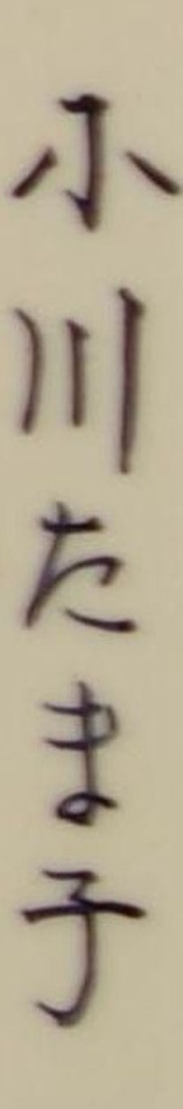小川たま子
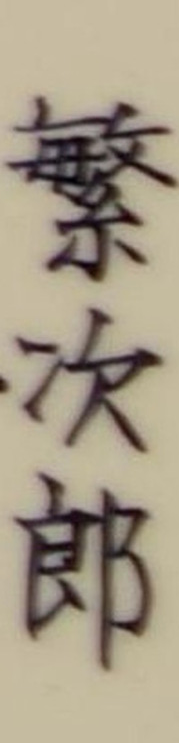繁次郎
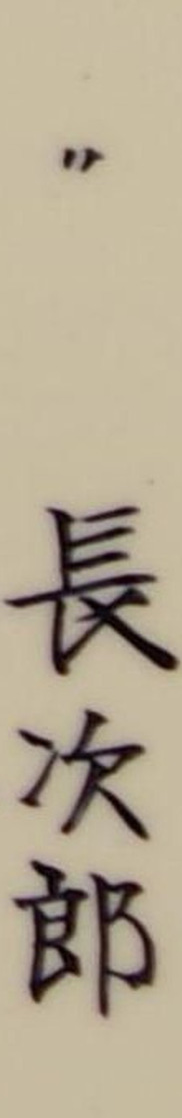長次郎
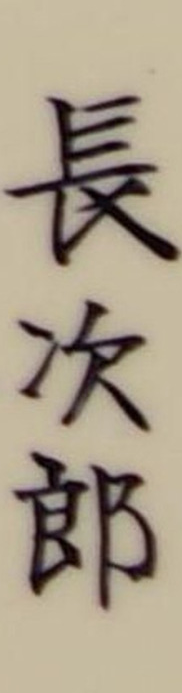長次郎
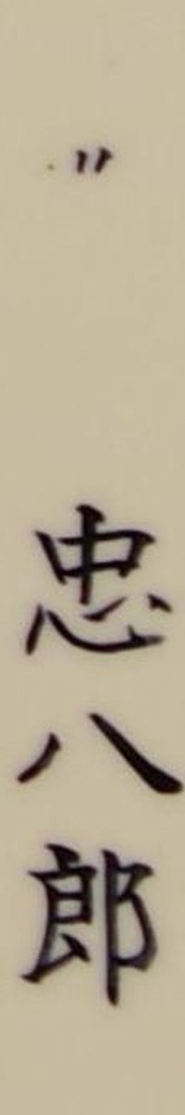忠八郎
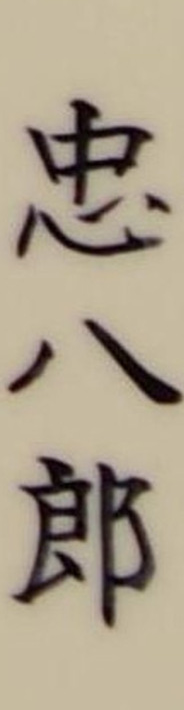忠八郎
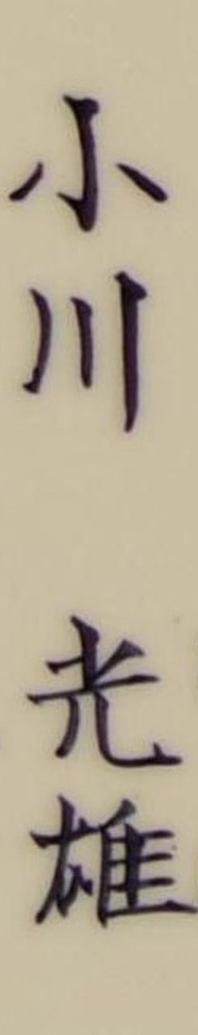小川光雄
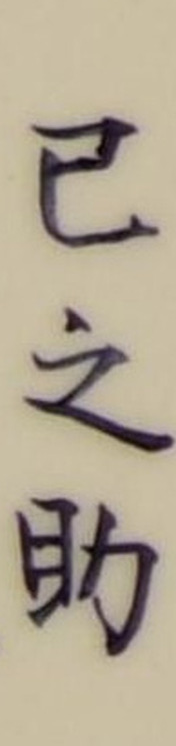巳之助

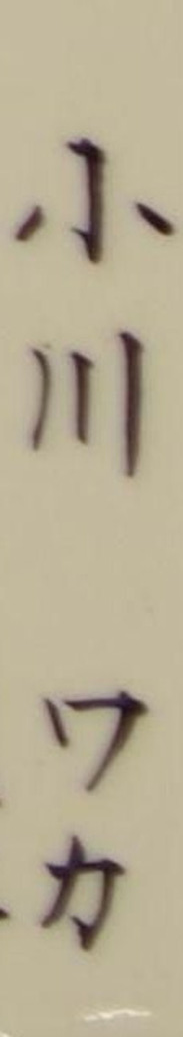小川ワカ
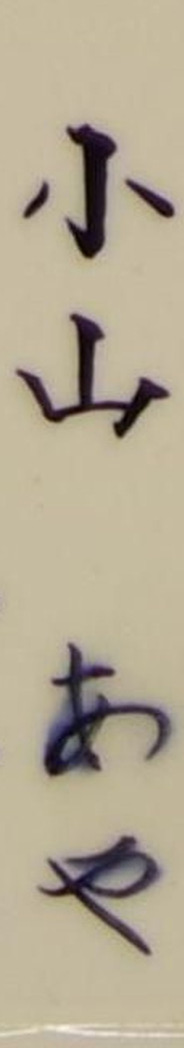小山あや
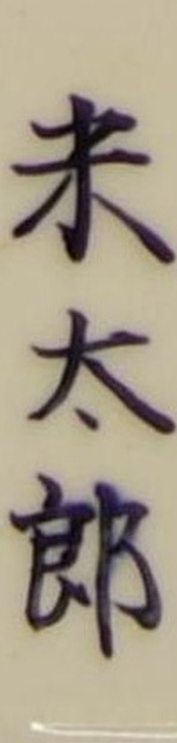米太郎
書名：E~L
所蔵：高野山金剛峯寺
